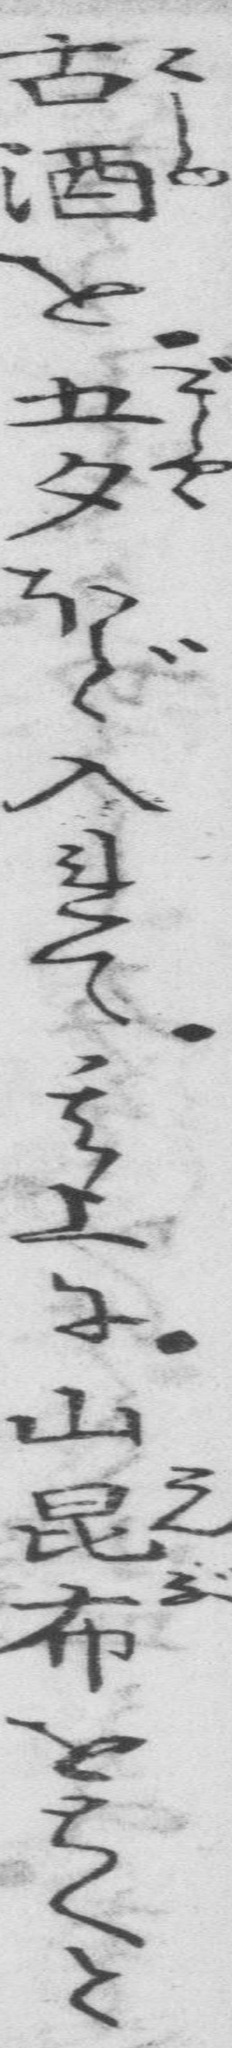古酒を。五勺ほど入れて。其上に。山昆布をとくと
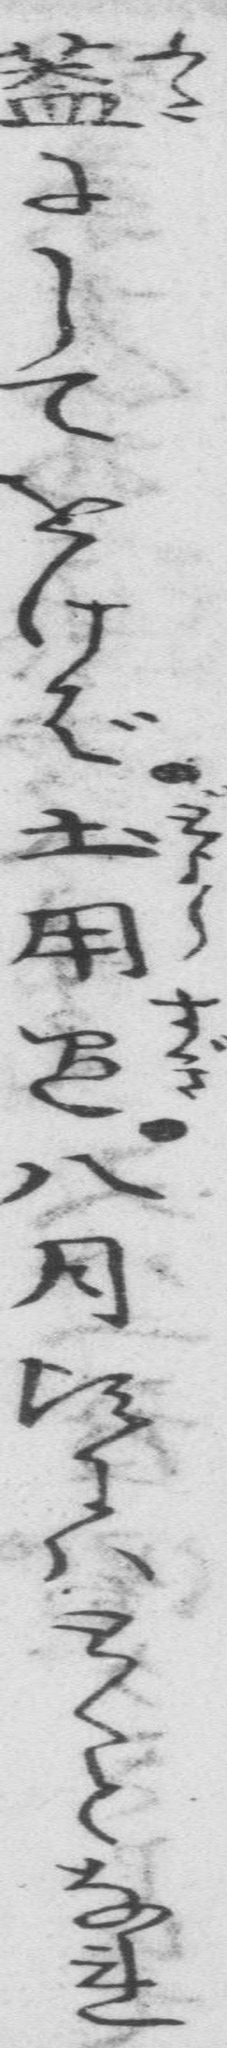蓋にしてをけば。土用過。八月頃にはとくとなれ
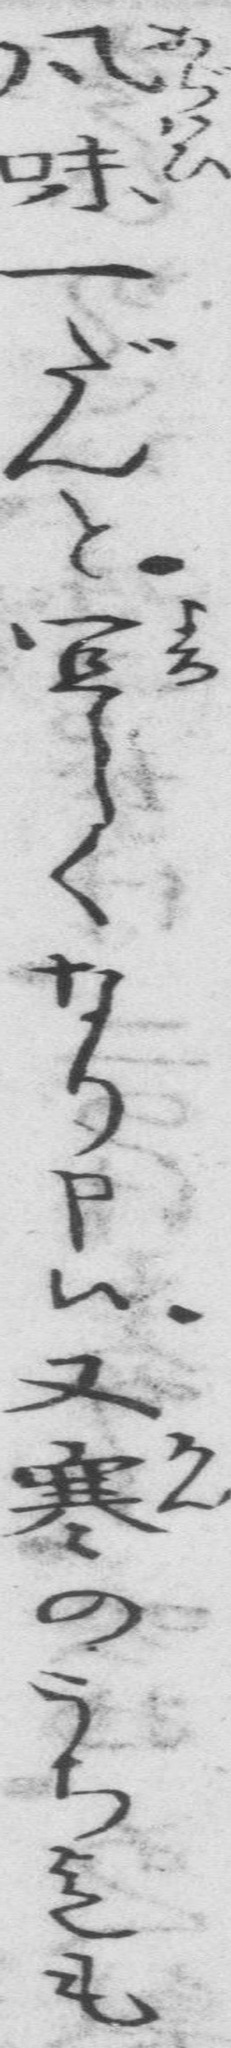風味一だんと。宜しくなり申候。又寒のうち迄も
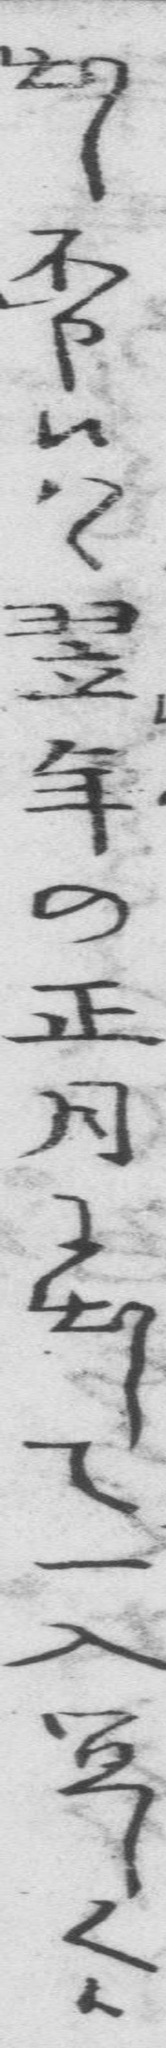出し不申候はゝ。翌年の正月に出して。一入宜しく候
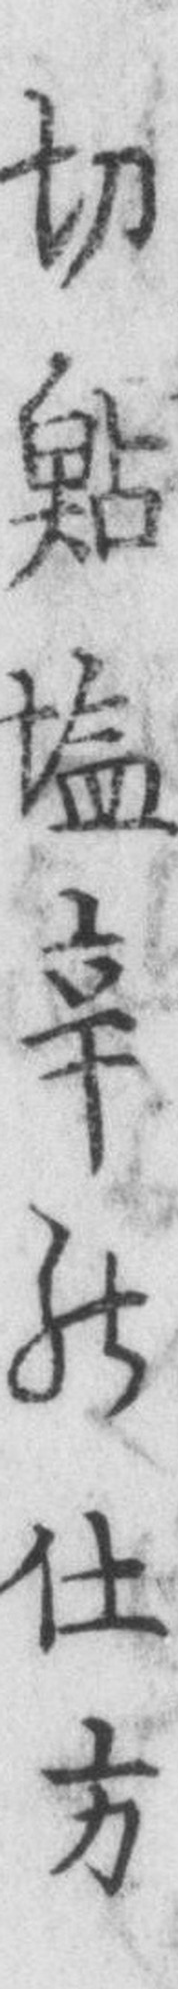切鮎塩辛の仕方
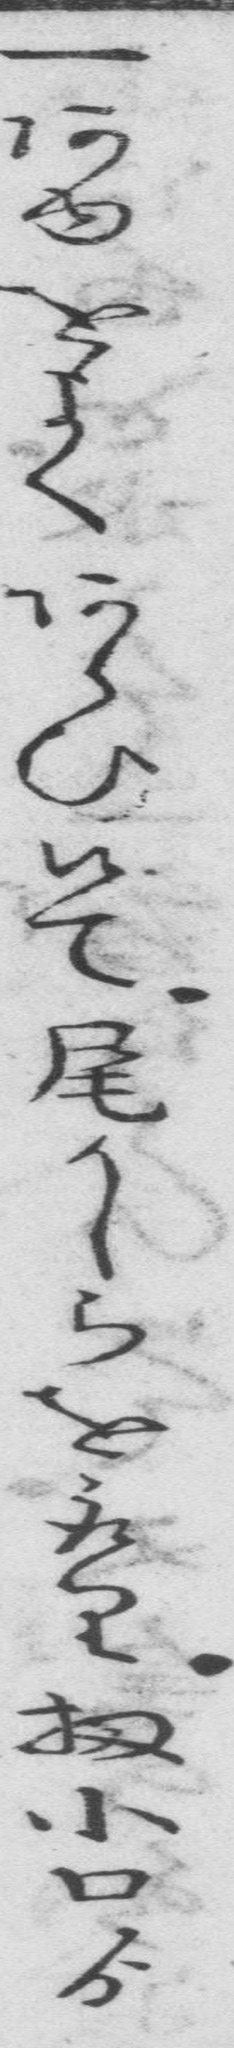一あゆをよくあらひ候て。尾かしらを取り。扨小口ゟ
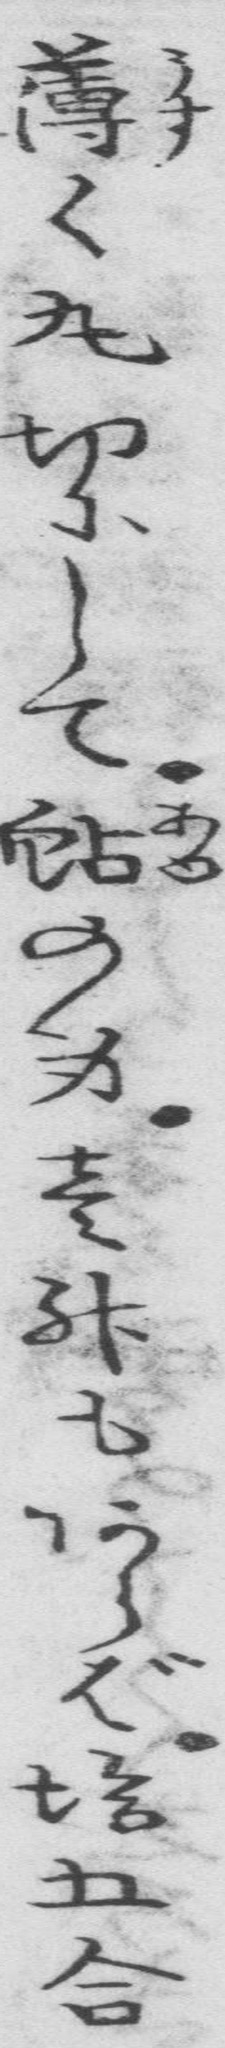薄く丸切にして。鮎の身。壱升もあらば。塩五合
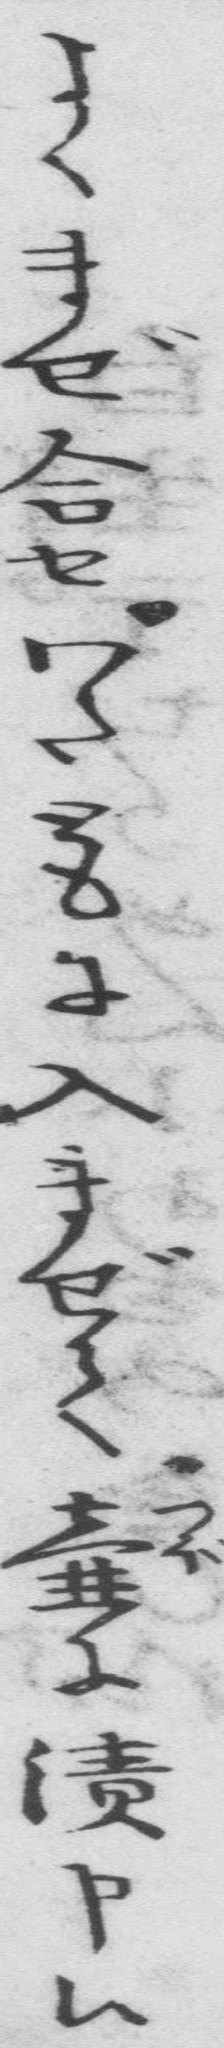よくまぜ合せ。わたともに入まぜて。壺に漬申候
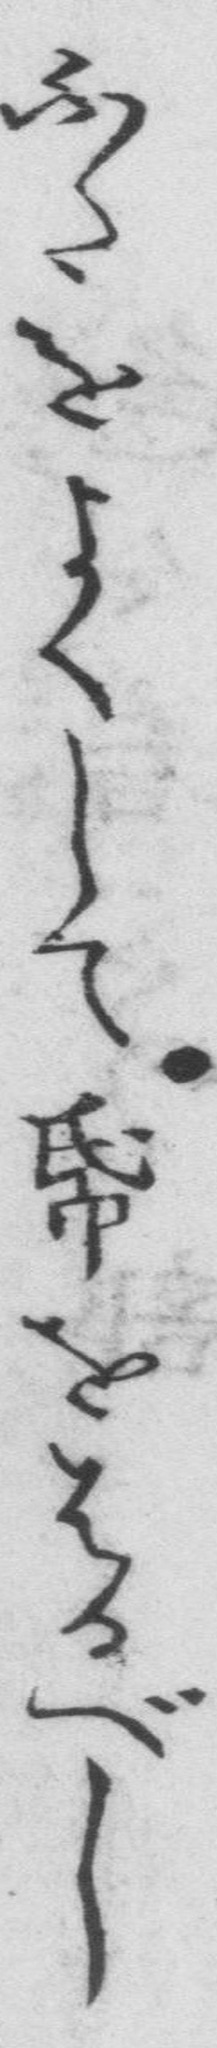ふたをよくして。紙をはるべし

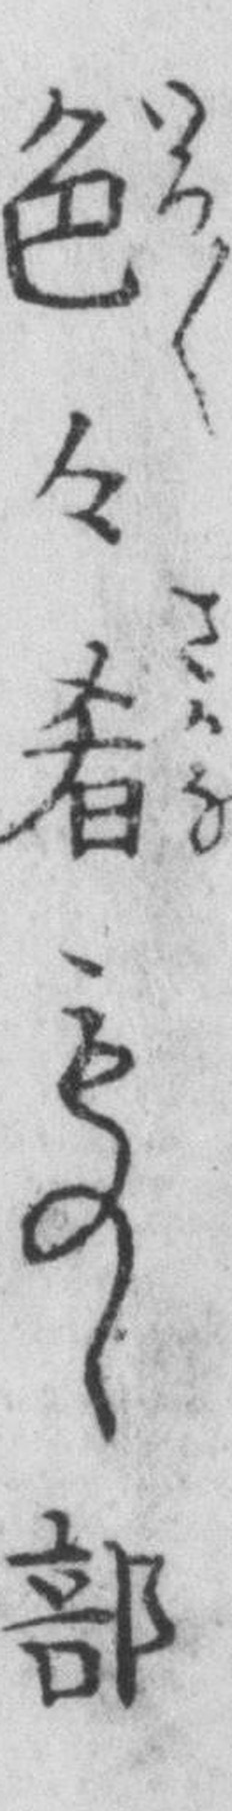色々肴ものゝ部
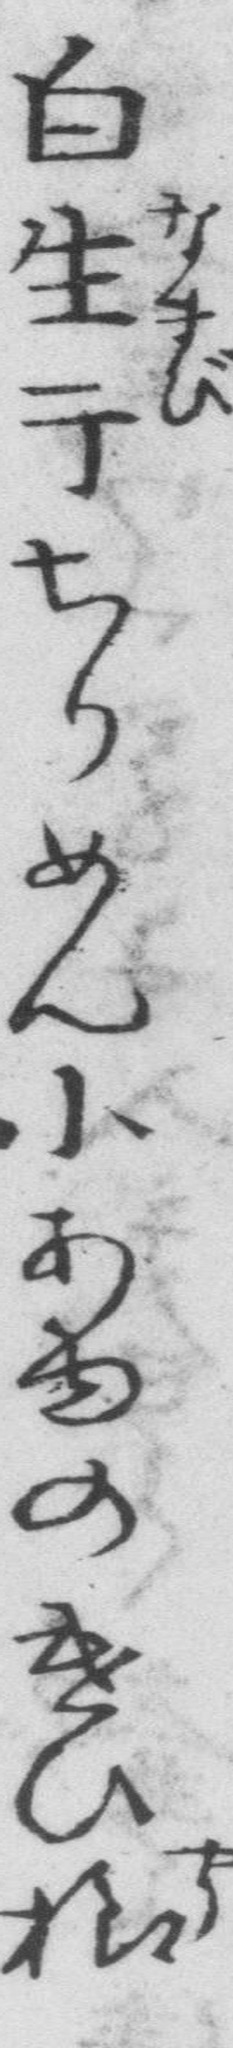白生干ちりめん小あゆの遣ひ様
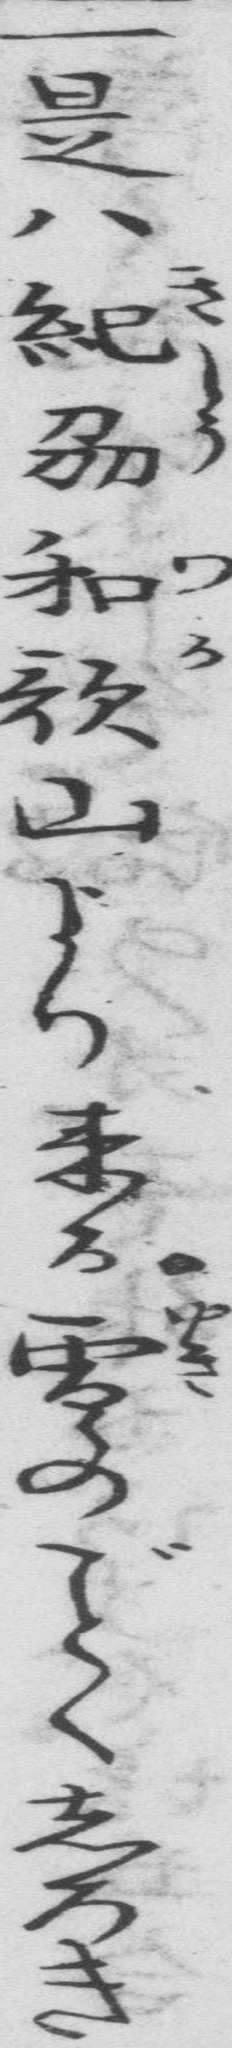一是は紀州和歌山より来る。雪のごとくしろき
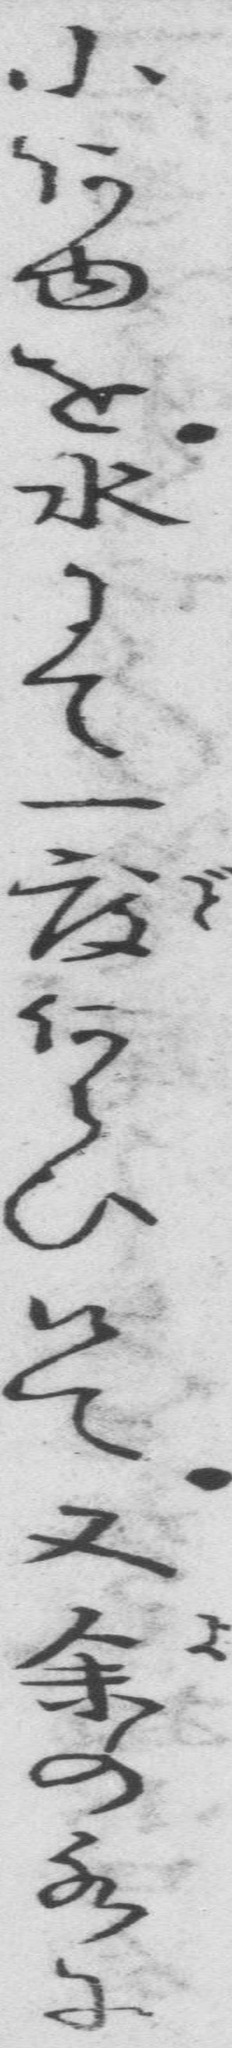小あゆを。水にて一度あらひ候て。又余の水に
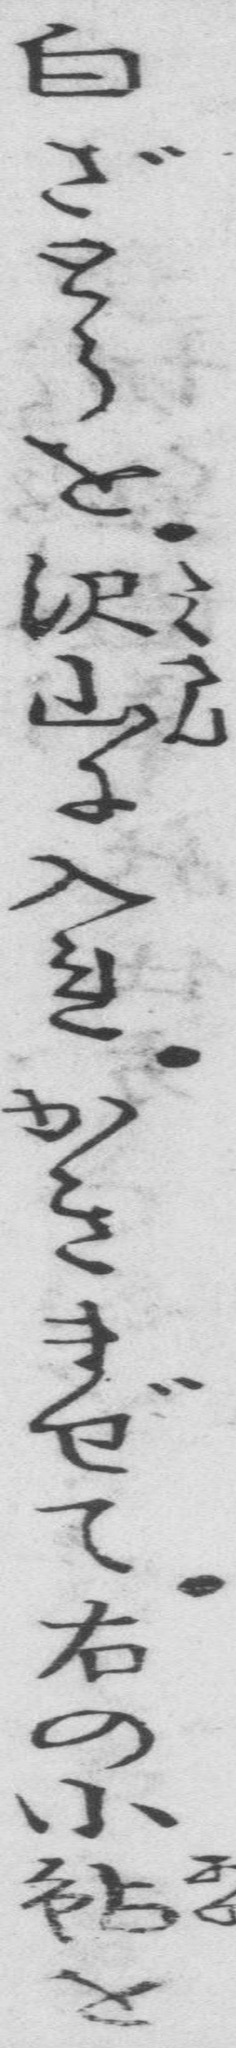白ざとうを。沢山に入れ。かきまぜて。右の小鮎を
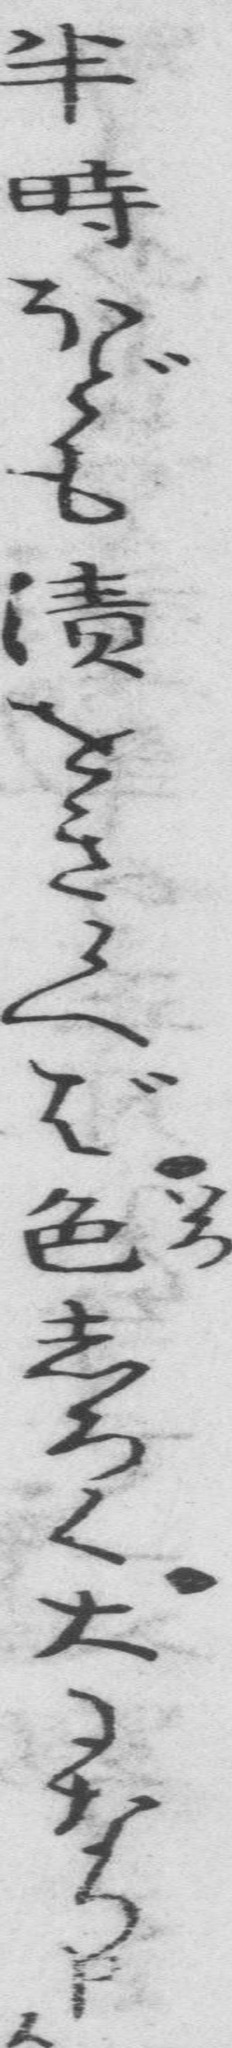半時ほども漬をき候へば。色しろく。大になり申候
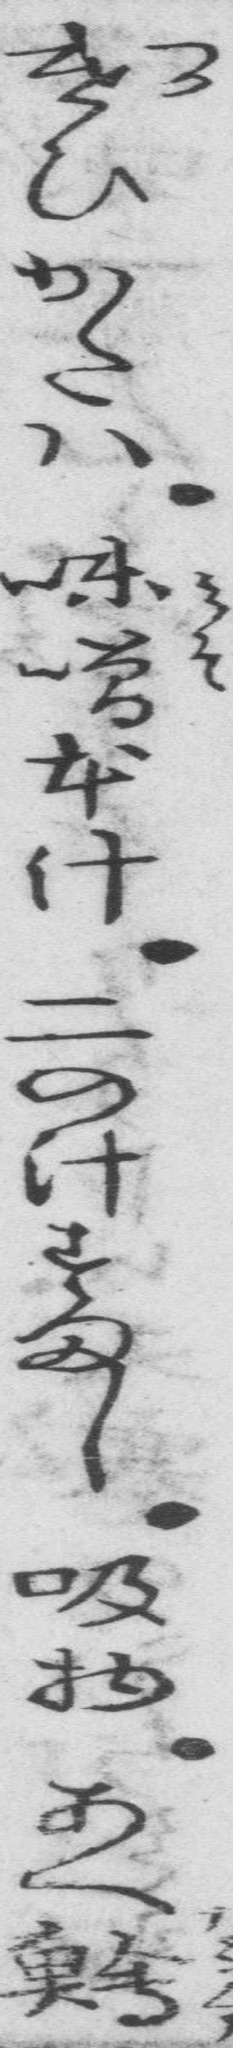遣ひかたは。味噌本汁。二の汁すまし。吸物。あへ鱠
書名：萬寳料理秘密箱
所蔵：大阪府立大学学術情報センター 国文学研究資料館
